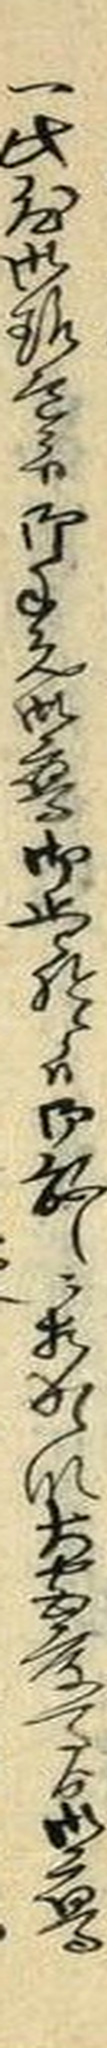一此度御趣意ニ付御手元御鷹御止被遊候ニ付御放しニ相成候段大宮藤馬ゟ御鷹
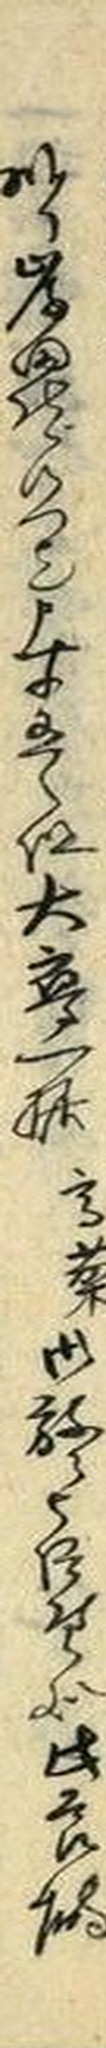掛り岸田次郎右衛門迄申聞有之但大鷹一裾高御放ニ被仰付候処此節飼
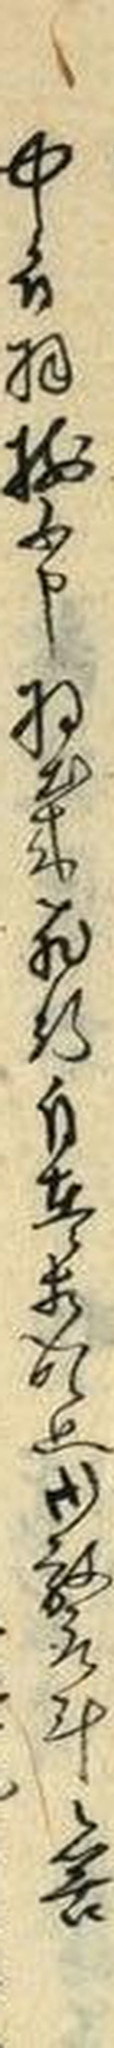中ニ付羽揃不申羽出来飛行自在ニ相成候上御放取斗候筈
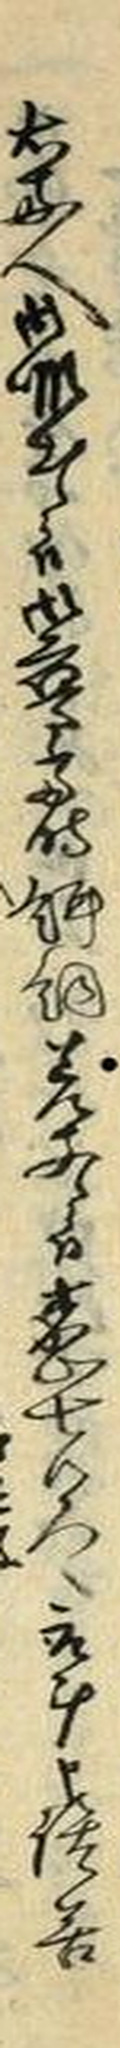右両人御暇出候ニ付御鷹当時餌飼差支候ニ付森山七右衛門へ取斗申談候筈

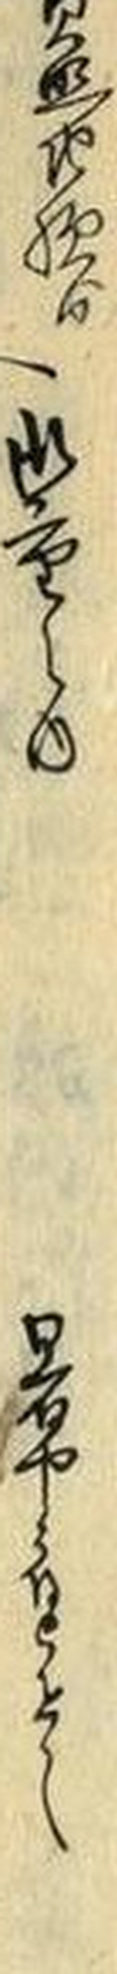貞照様ゟ御重之内暑中ニ付被進之
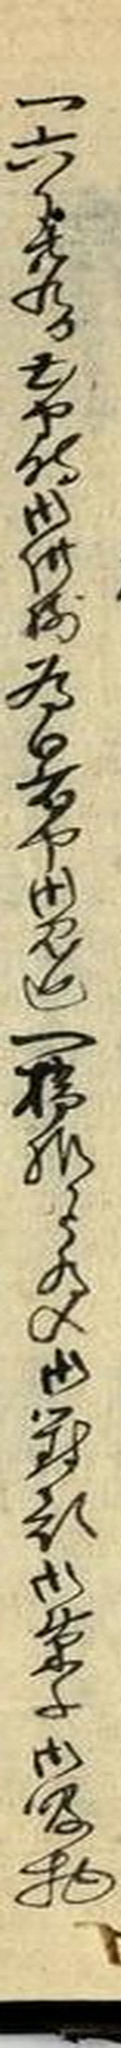一六月廿九日五半時御供揃為暑中御見廻一橋様へ被為入御対顔御菓子御吸物
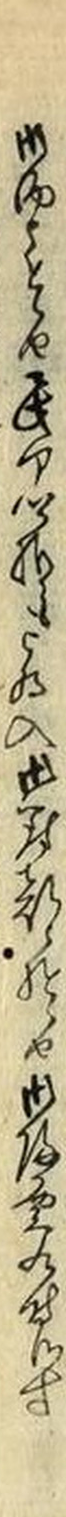御酒被進候由民部卿様も被為入御対顔被遊候由御帰殿九時弐寸
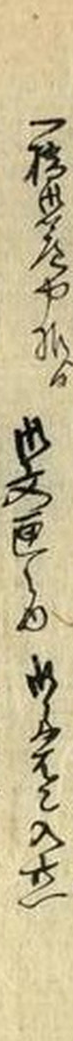一橋御簾中様ゟ御文匣之内御たはこ入廿一
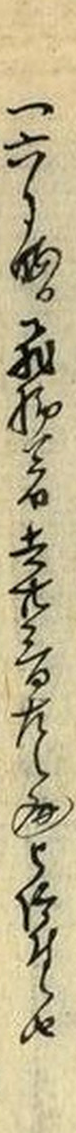一六月晦日飛脚着去廿三日左之通被仰付候由
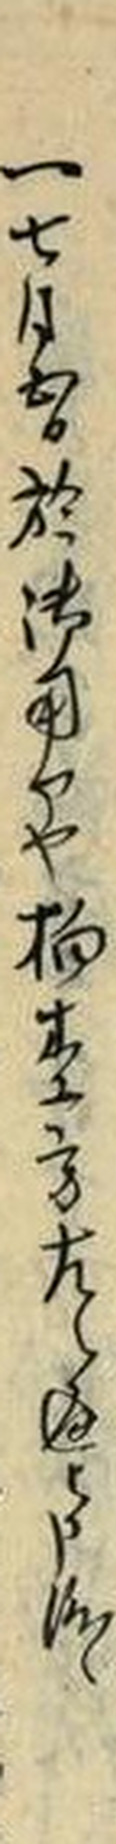一七月五日於御用部や狛木工方左之通被仰渡候
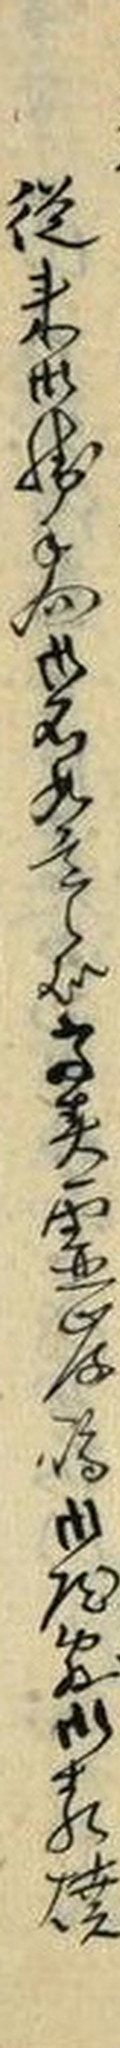従来御勝手向御不如意候処当春霊岸嶋御屋敷御類焼

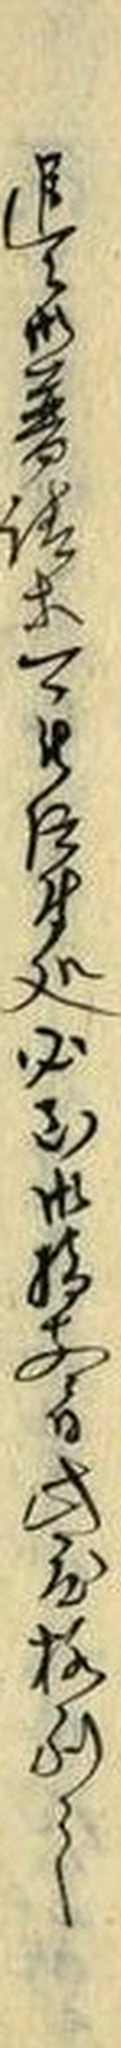追々御普請等可被片付候処必至御指支ニ付此度格別之
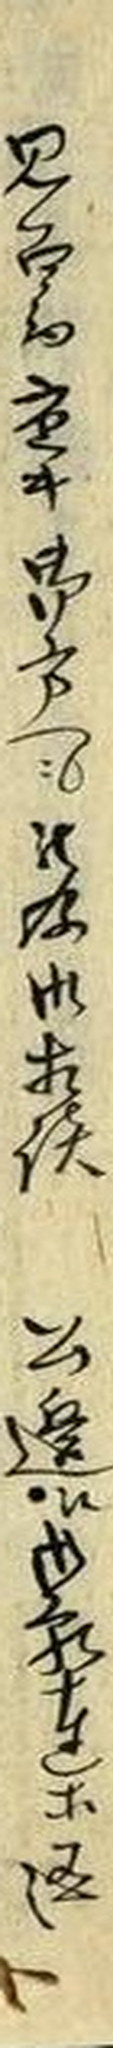思召ニ而重キ御方へも被及御相談公辺江御願達等有之
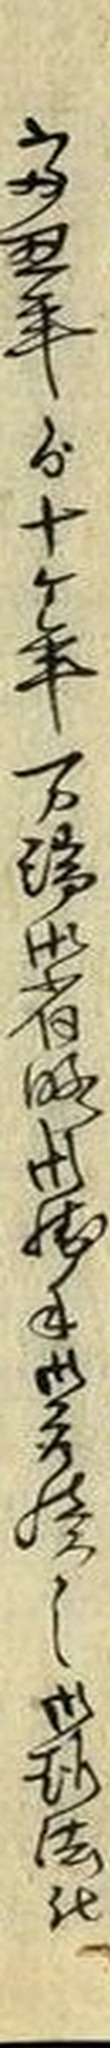当丑年ゟ十ヶ年万端御省略御勝手御取続之御趣法被
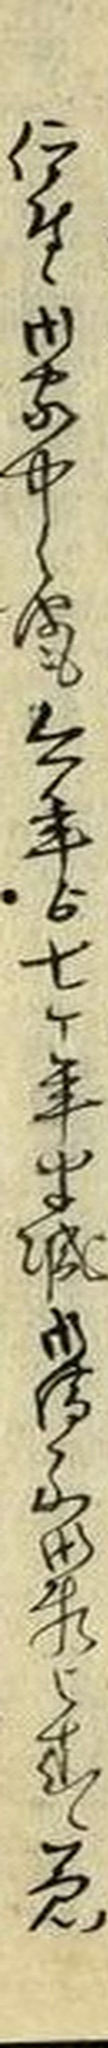仰付候御家中之儀も今年ゟ七ヶ年半減御借米御頼被成候兼
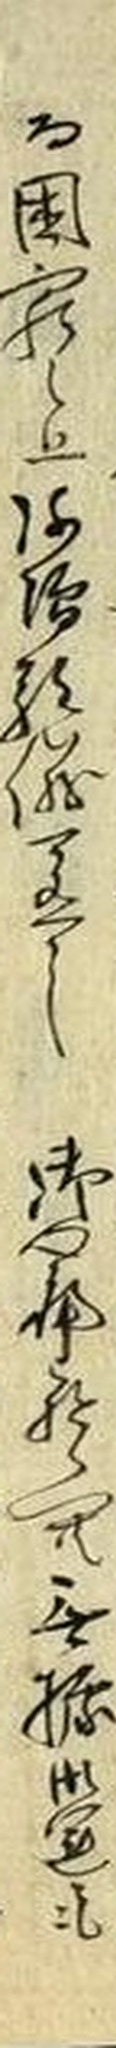而困窮之上弥増難儀可有之御心痛被遊候へ共無拠御運ニも
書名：少傅日録抄（斉承付側向頭取日記、在府）
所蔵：福井県文書館 Fukui Prefectural Archives
